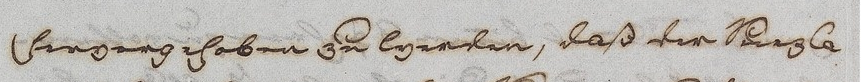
hervorgehoben zu werden, daß der SuezCa-
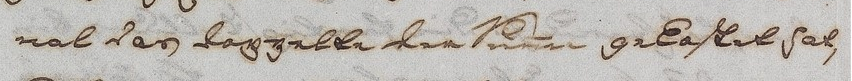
nal das doppelte der Summe gekostet hat,
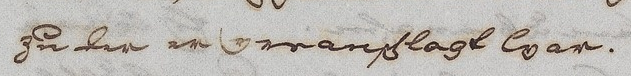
zu der er veranschlagt war.
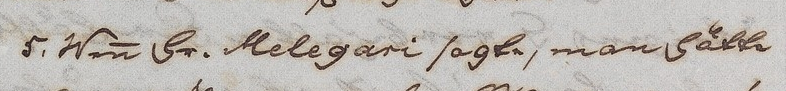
5. Wenn Hr. Melegari sagte, man hätte
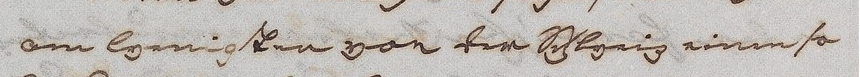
am wenigsten von der Schweiz einen so
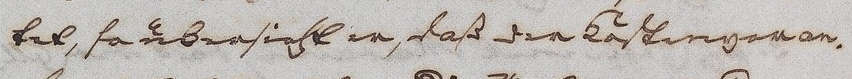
tet, so übersieht er, daß der Kostenvoran-
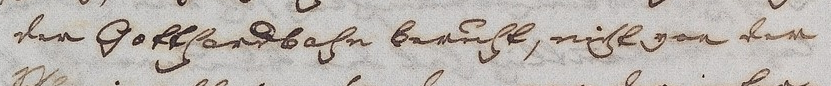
der Gotthardbahn beruht, nicht von der
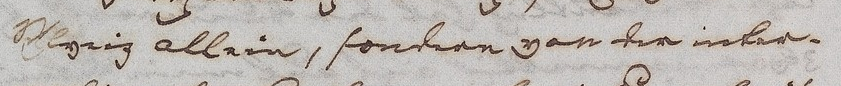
Schweiz allein, sondern von der inter-
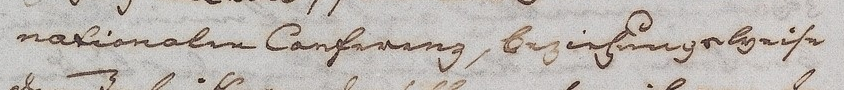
nationalen Conferenz, beziehungsweise
